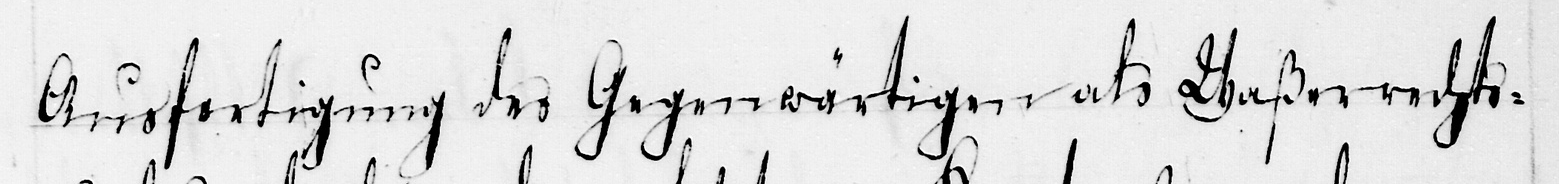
Ausfertigung des Gegenwärtigen als Waßerrechts¬
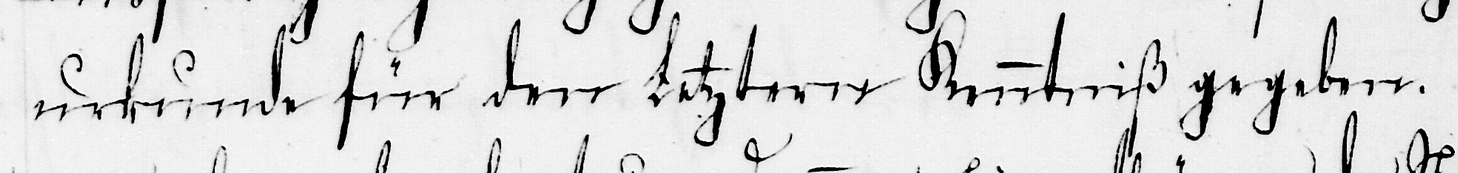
urkunde für den Letztern Kenntniß gegeben.
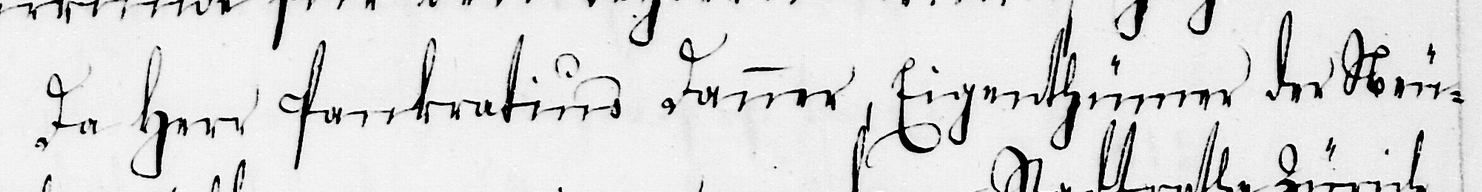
Da Herr Pankratius Danner, Eigenthümer der Neu¬
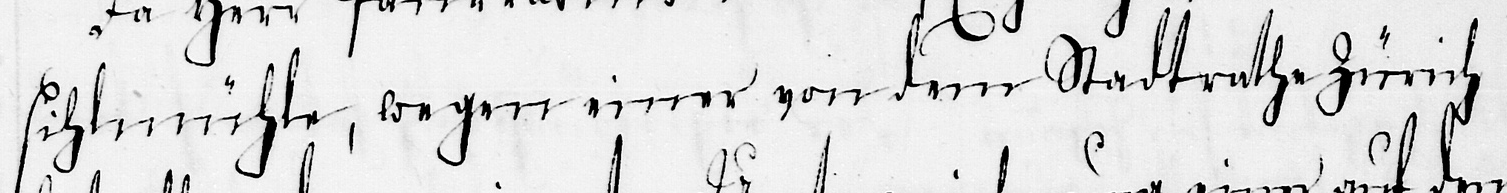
sihlmühle, wegen einer von dem Stadtrathe Zürich
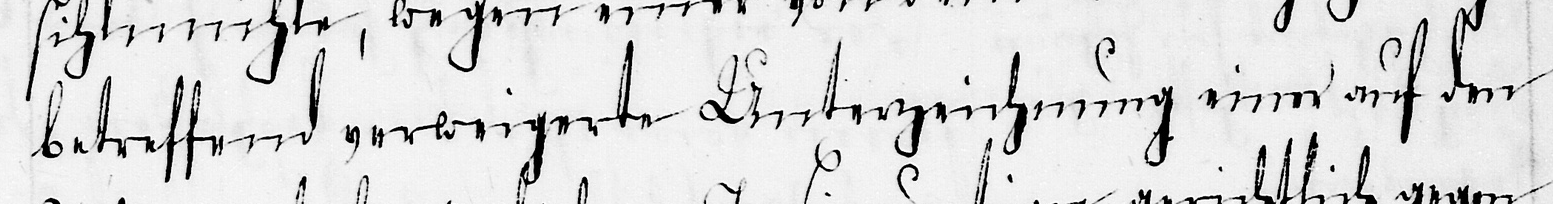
betreffend verweigerte Unterzeichnung einer auf den
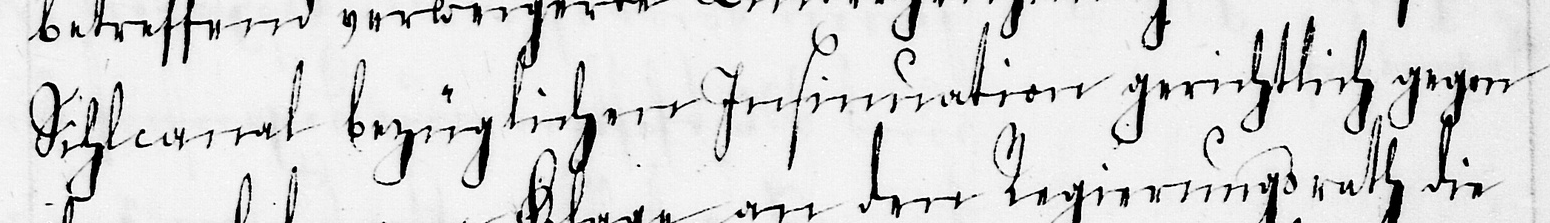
Sihlcanal bezüglichen Insinuation gerichtlich gegen
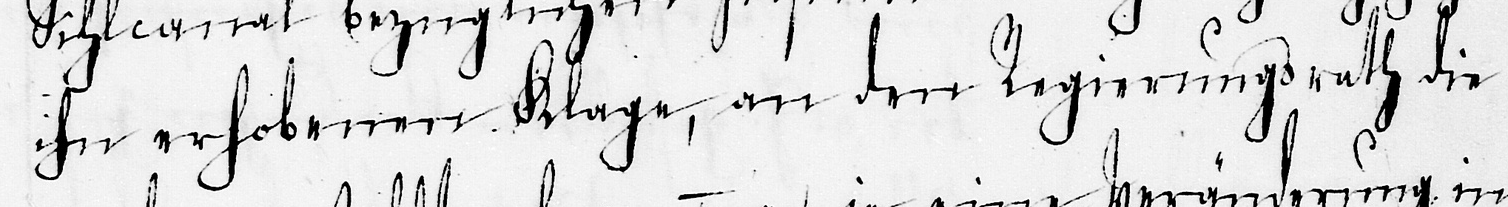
ihn erhobenen Klage, an den Regierungsrath die
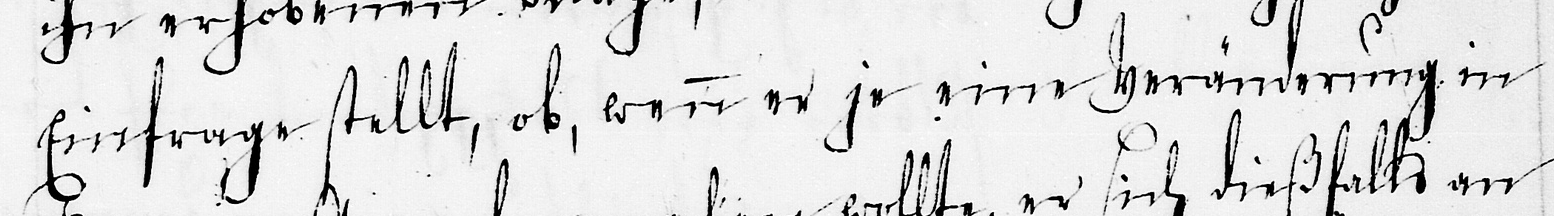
Einfrage stellt, ob, wenn er je eine Veränderung in
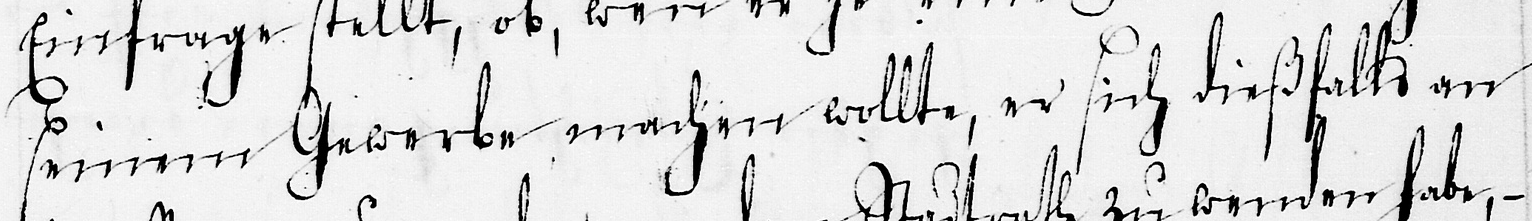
seinem Gewerbe machen wollte, er sich dießfalls an
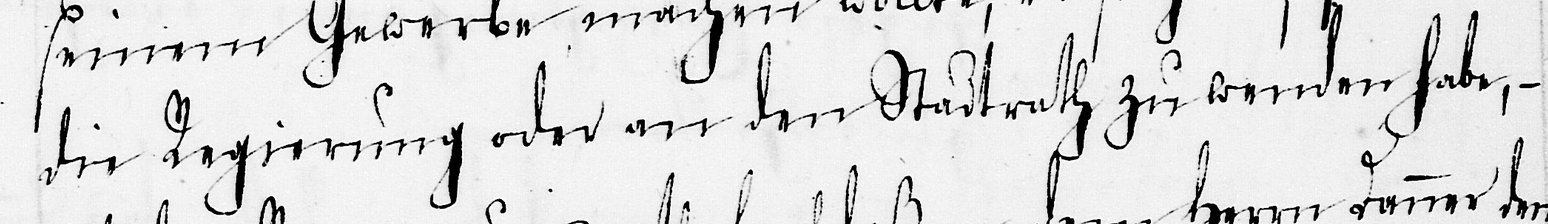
die Regierung oder an den Stadtrath zu wenden habe, –
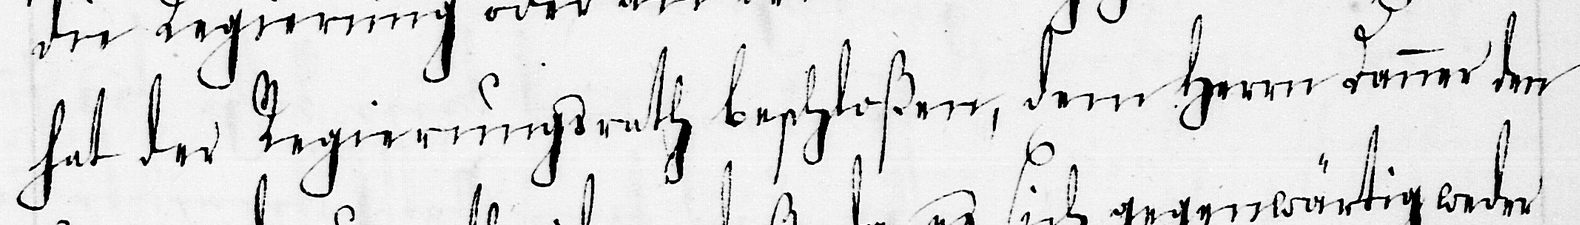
hat der Regierungsrath beschloßen, dem Herrn Danner den
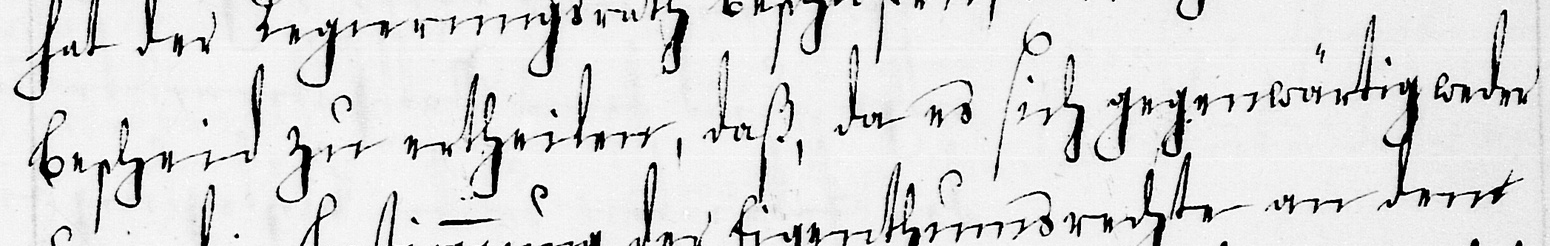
Bescheid zu ertheilen, daß, da es sich gegenwärtig weder
